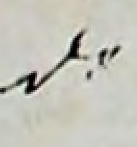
do
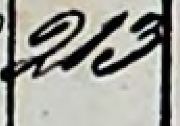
213
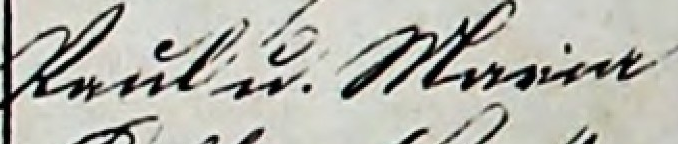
Paul u. Maria
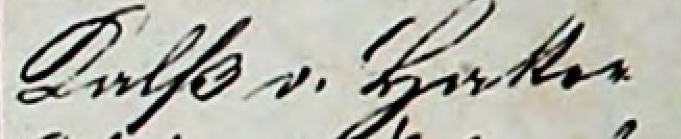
Kalß v. Haker
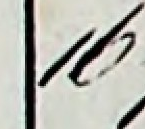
16
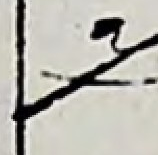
7
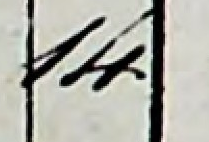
14
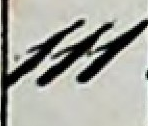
111
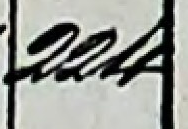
224
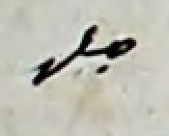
do
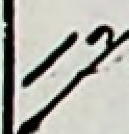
17
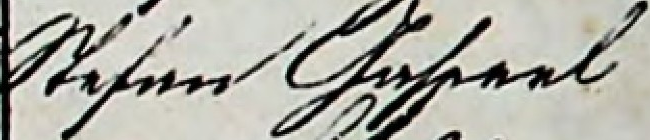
Stefan Gasperl
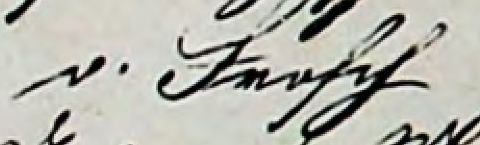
v. Frosch
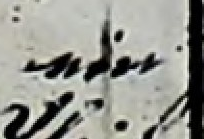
ein
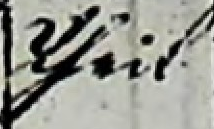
Theil
